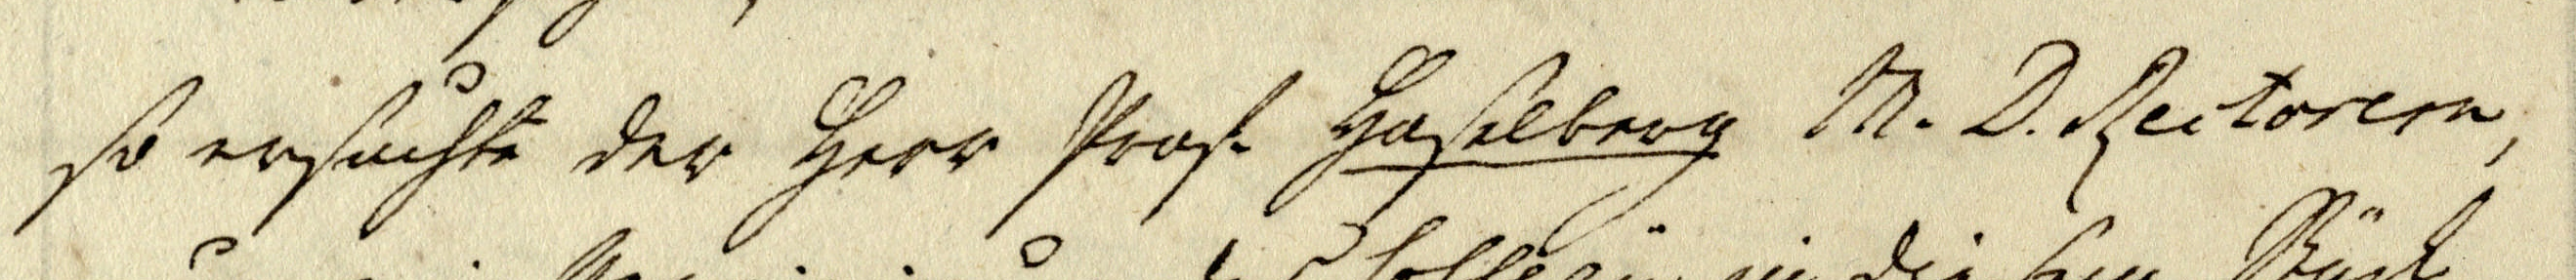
so ersuchte der Herr Prof. Haselberg M. D. Rectorem,
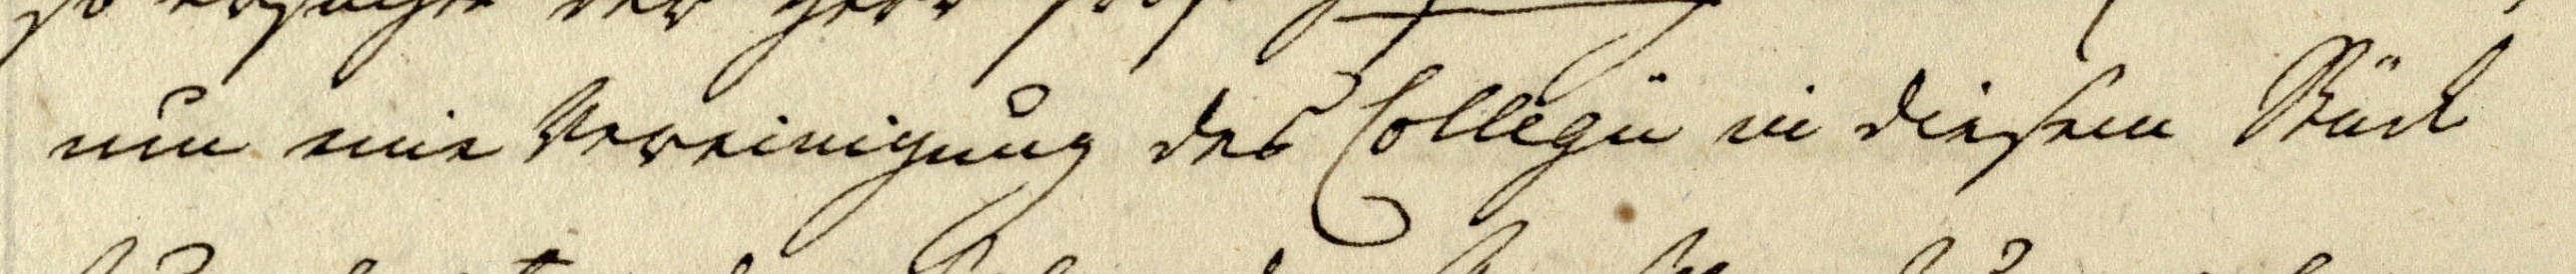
um eine Vereinigung des Collegii in diesem Stück
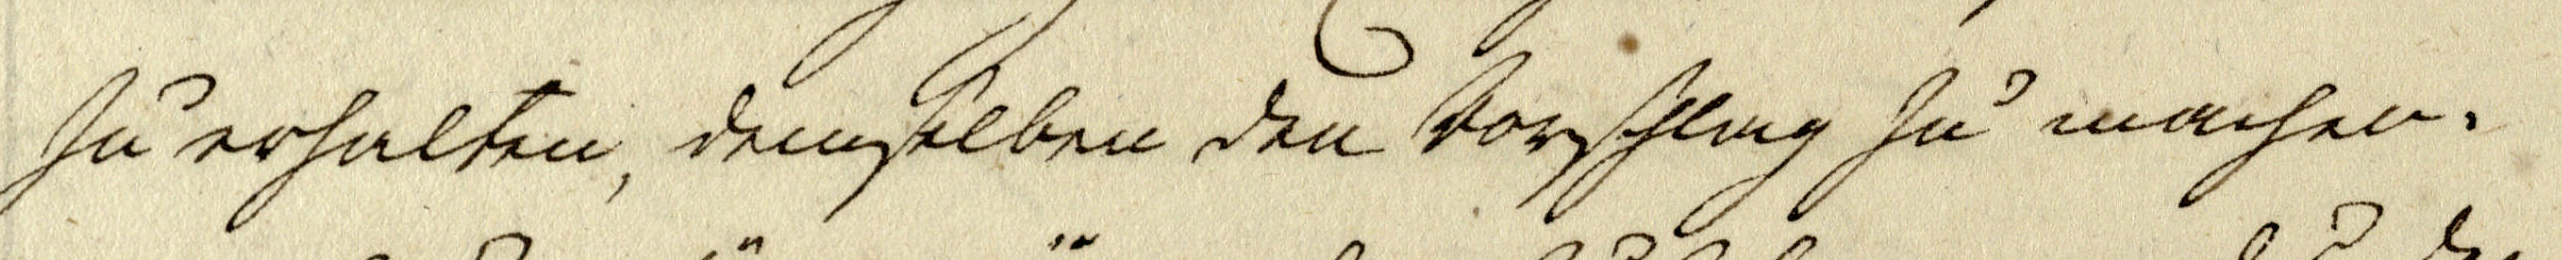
zu erhalten, demselben den Vorschlag zu machen:
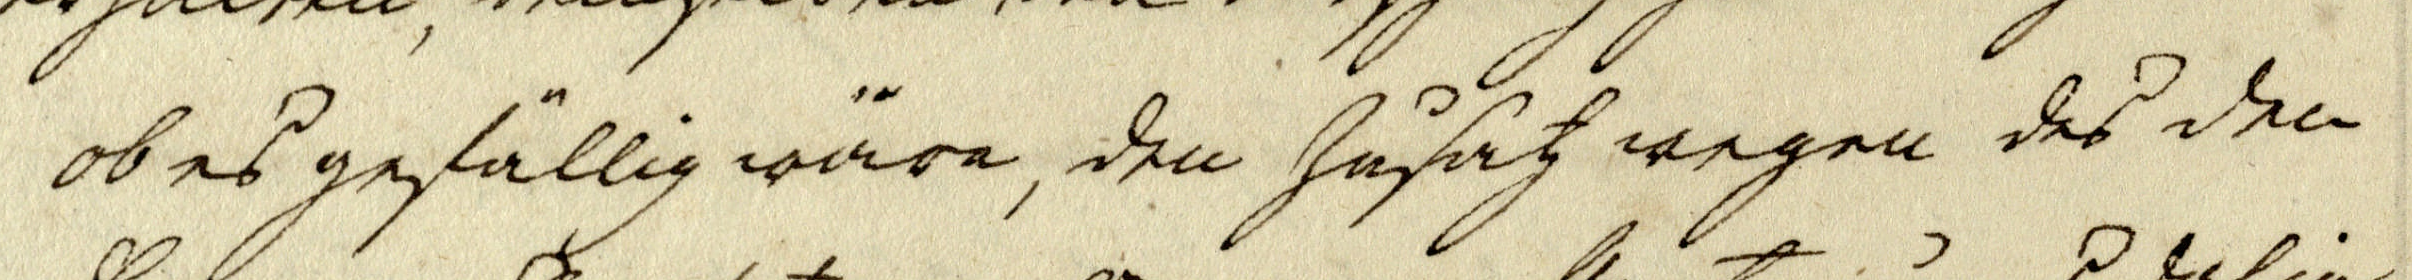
ob es gefällig wäre, den Zusatz wegen des den
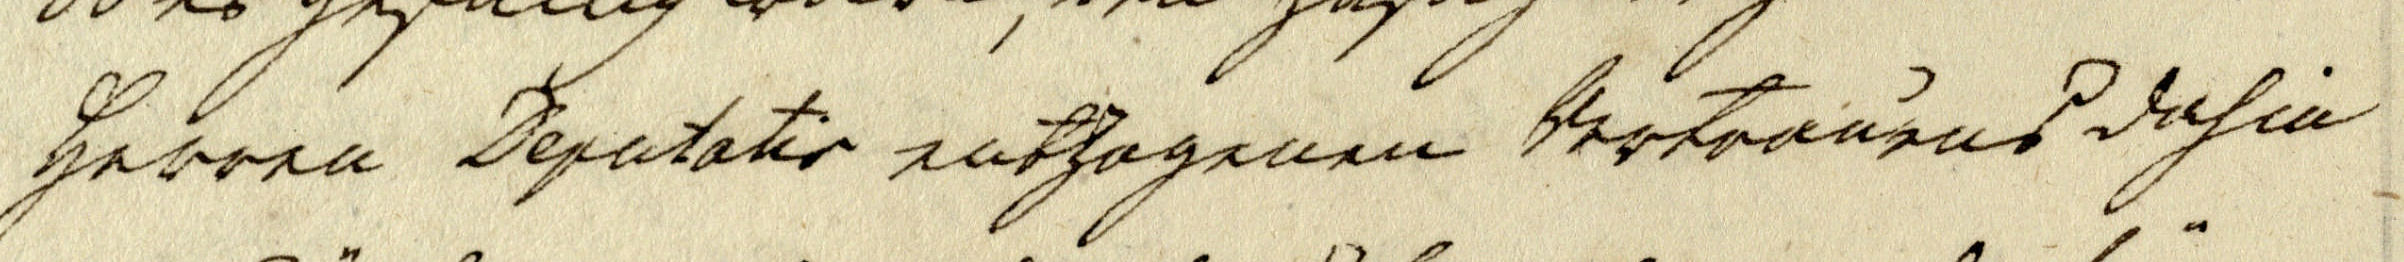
Herren Deputatis entzogenen Vertrauens dahin
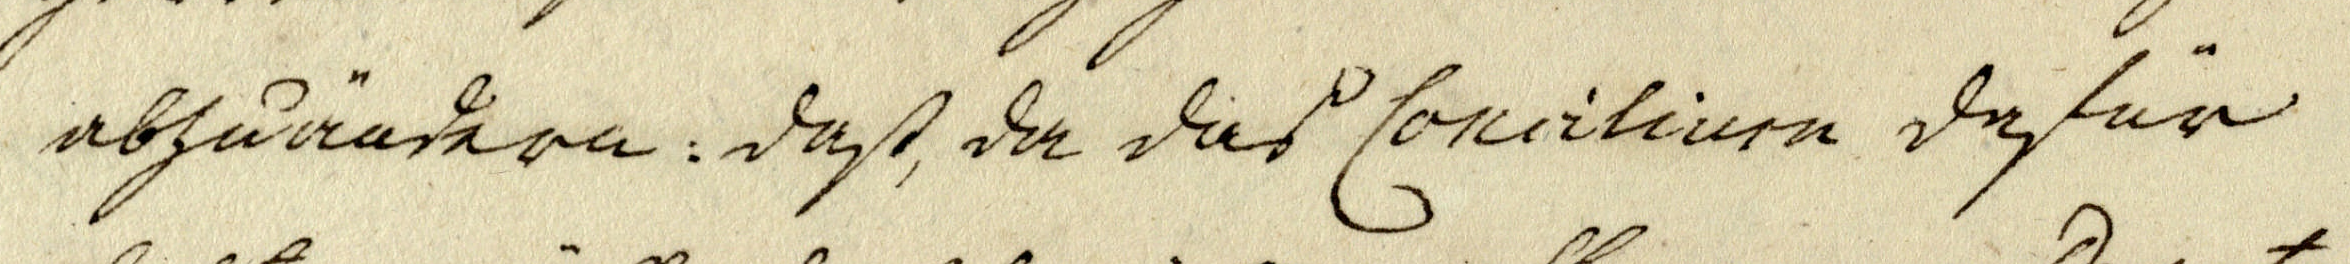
abzuändern: daß, da das Concilium dafür
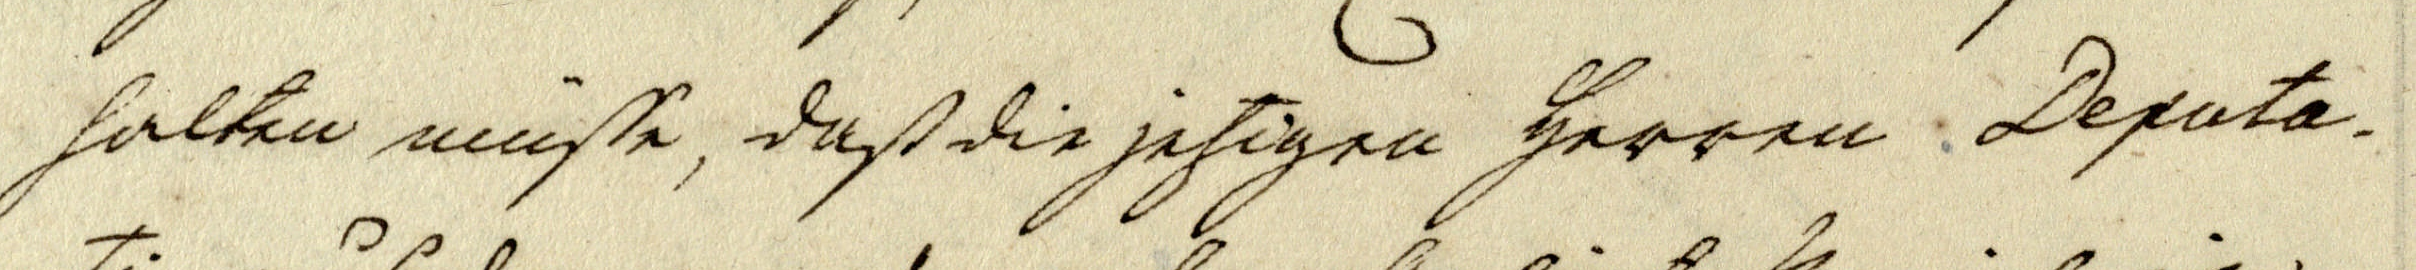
halten müsse, daß die jetzigen Herren Deputa¬
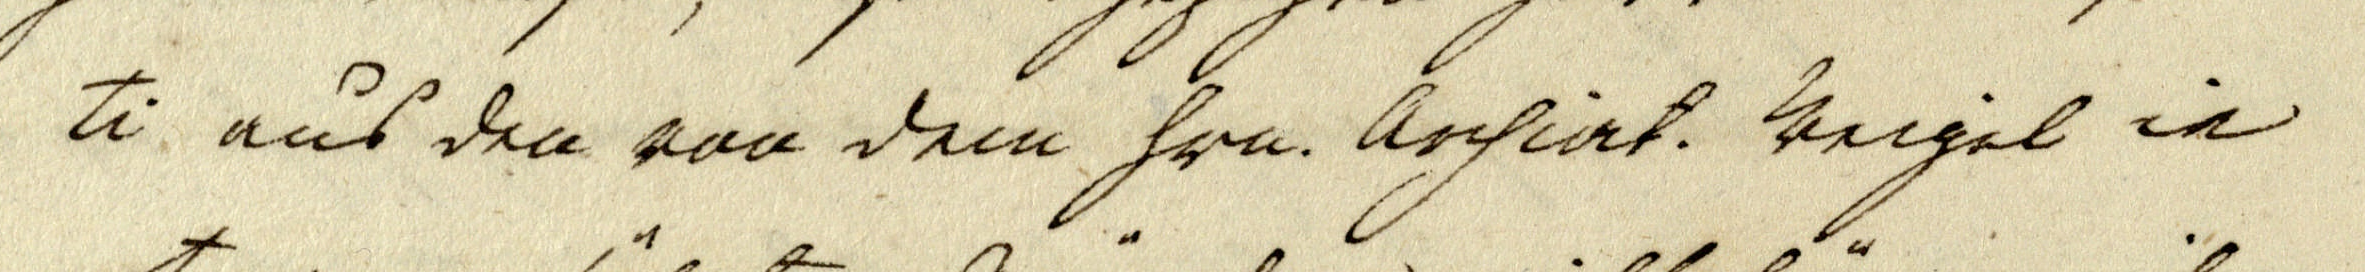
ti aus den von dem Hr. Archiat. Weigel in
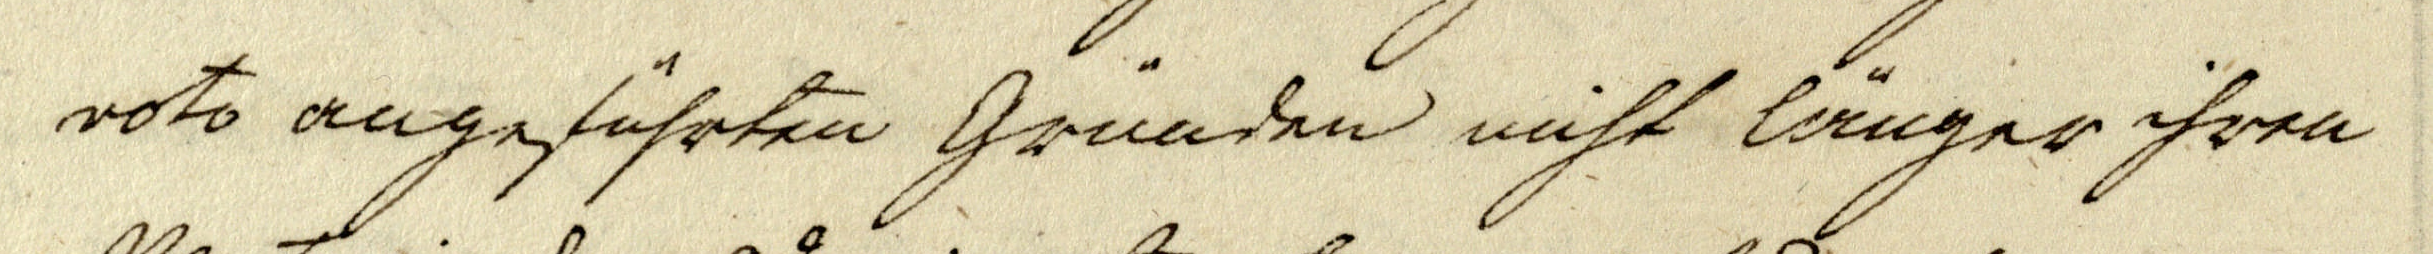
voto angeführten Gründen nicht länger ihren
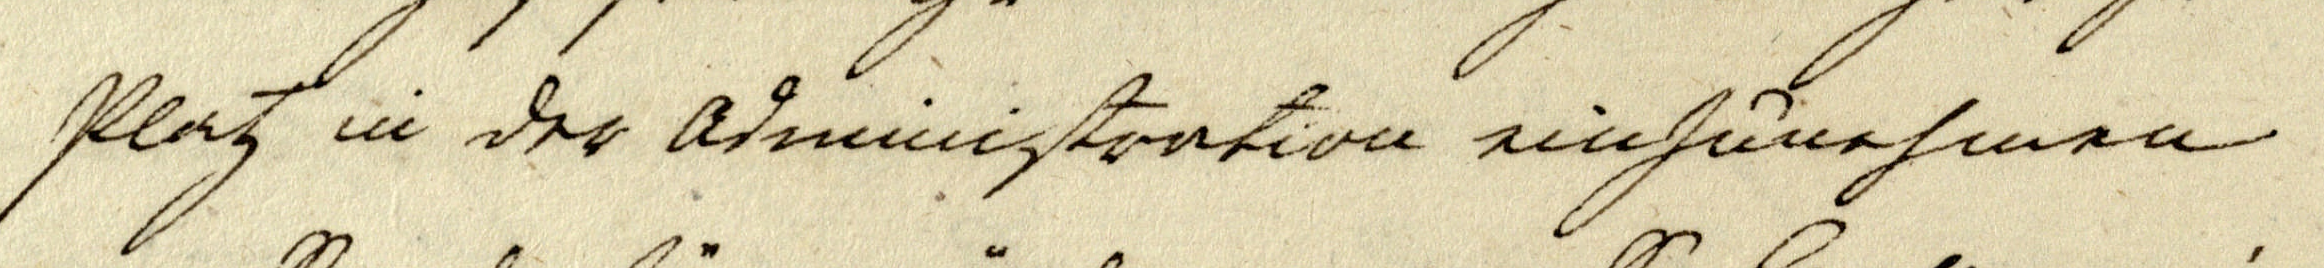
Platz in der Administration einzunehmen
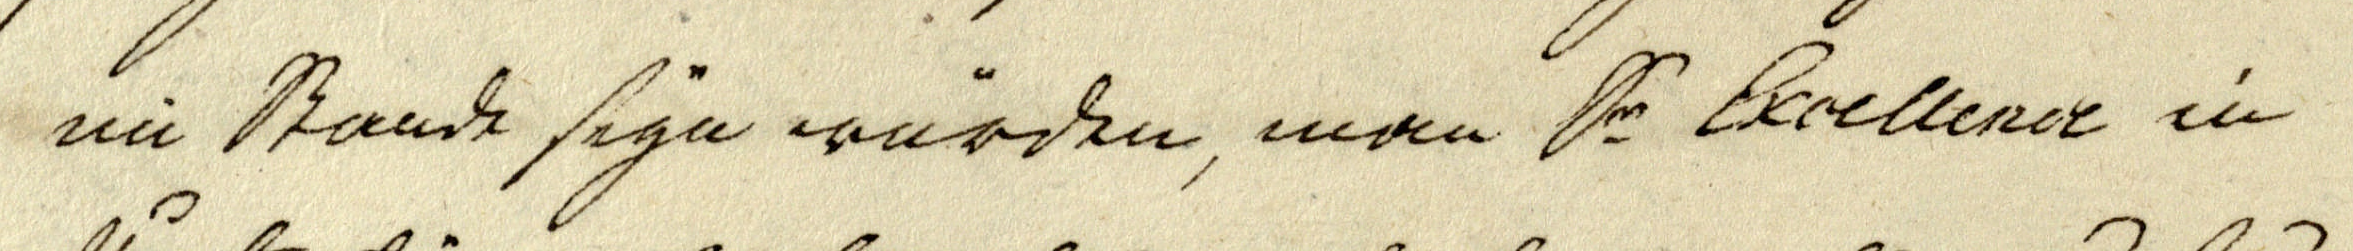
in Stande seÿn würden, man Sr Excellence in
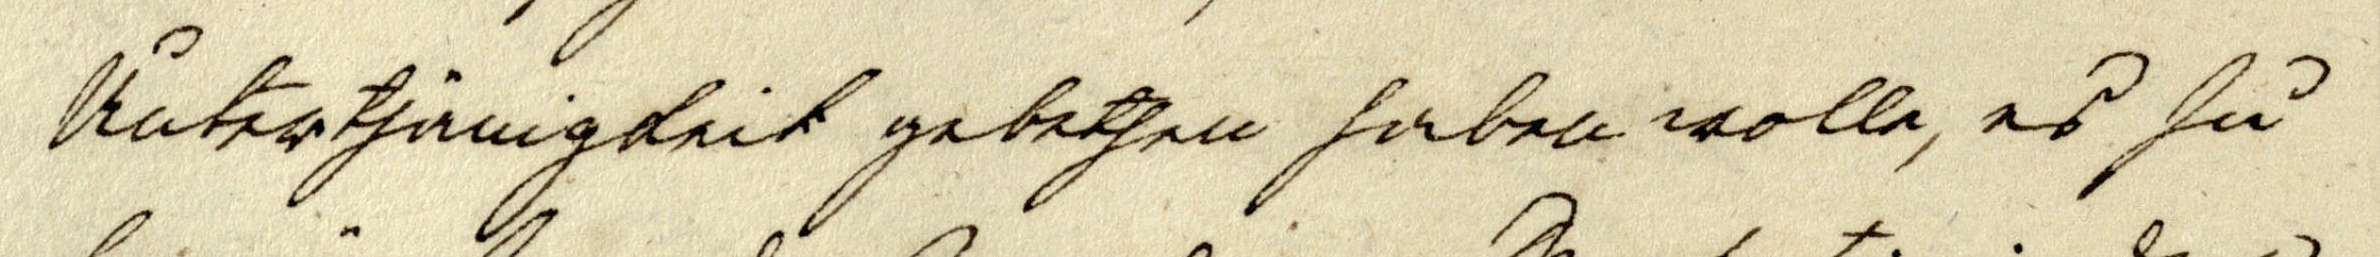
Unterthänigkeit gebethen haben wolle, es zu
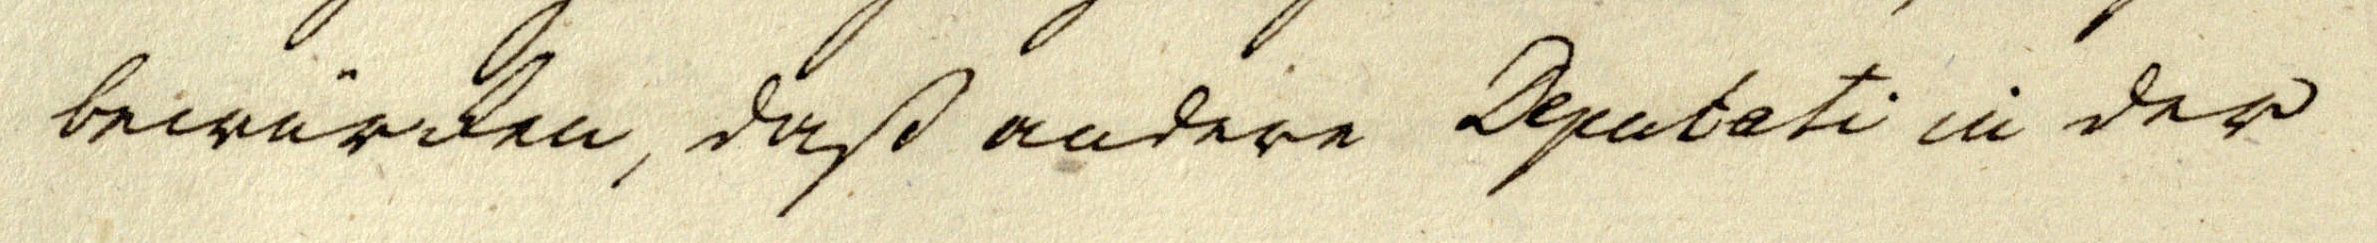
bewürcken, daß andere Deputati in der
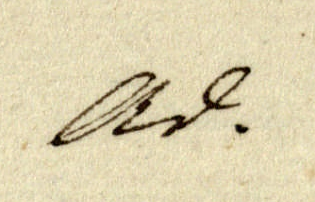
Ad
